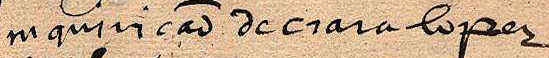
Jnquirição de crara lopez
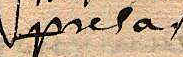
presa ./
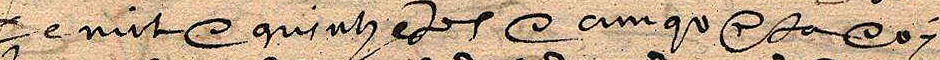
De mil e quinhētos e cimqoēta e oy
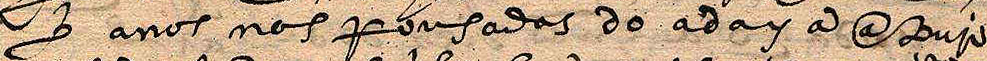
to anos nas pousadas do adayā ātonjo
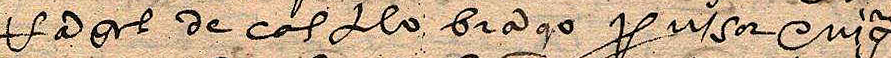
Rāgel de castelo brāqo ꝓuisor e uigro
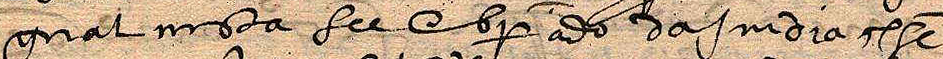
geraL nesta see e bpādo da Jmdia cꝭ sē
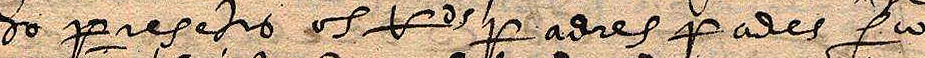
do presētes os Ros padres padres fco
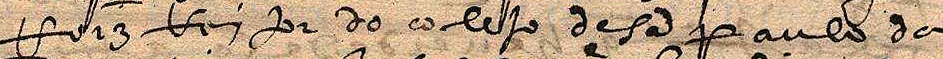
Roiz Reytor do coleJo de sā paulo da
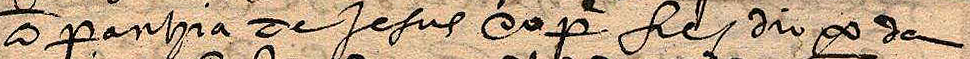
c̄opanhia de Jesus e o pe frej diogo da
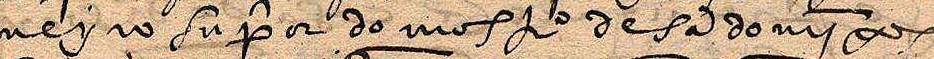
ueyro sup̄or do mostro de sā domj̄gos
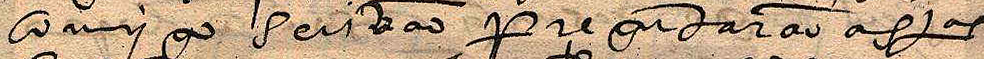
comygo scrivão pregūtarão as tas
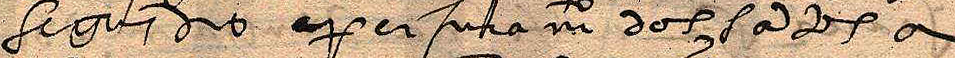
seguj̄tes per Juramto dos sātos a
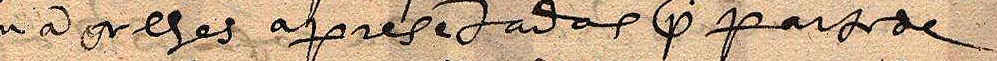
uāgelhos apresētadas p̄o parte de
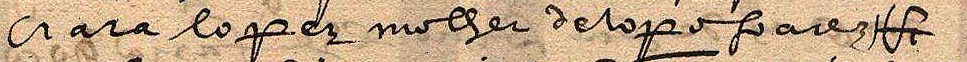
crara lopez molher de lopo soares Re
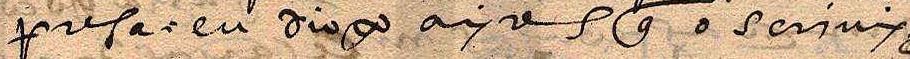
presa e eu diogo ayres q̄ o scriuy
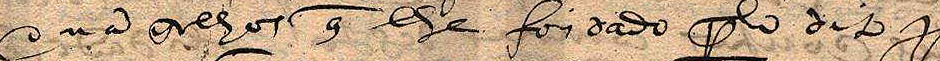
euāgelhos q̄ lhe foy dado p̄lo dito ꝓ
